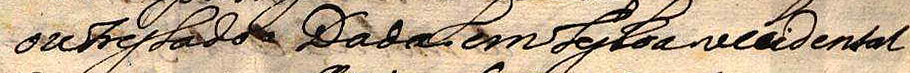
ou treslado Dada em Lisboa occidental
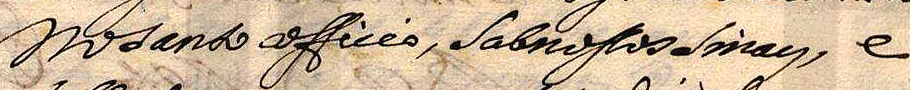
no santo officio, sob nossos sinaes, e
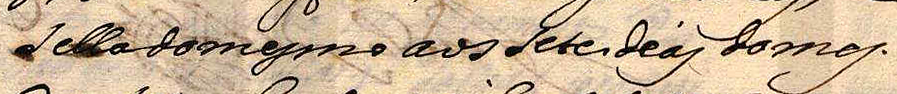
sello do mesmo aos sete dias do mes.
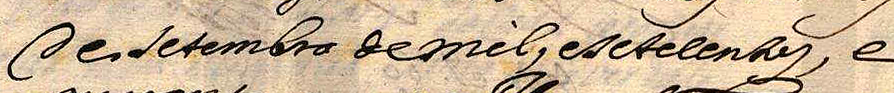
de setembro de mil, e setecentos, e
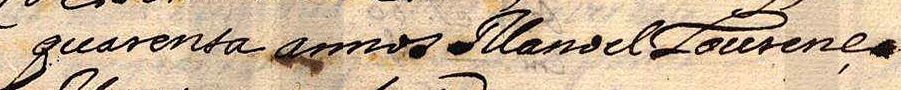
quarenta annos Manoel Lourenço
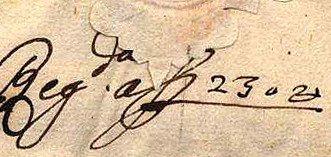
Reg.da a fl 2303
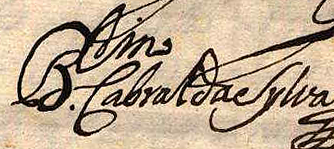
B.dino Cabral da Sylva
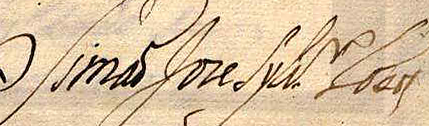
Simaõ Joze Sylv.ro Lobo
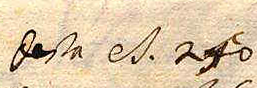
desta e I. 250
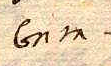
conta
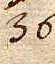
36
